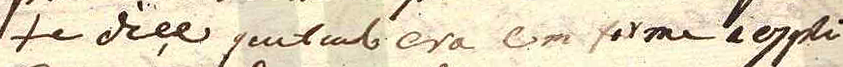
te diçe que tudo era conforme a espli
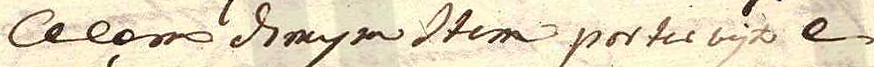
caçam do mesmo Item por ter visto e
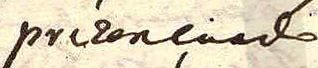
prezençiado
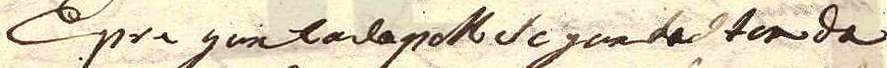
E preguntada pello segundo Item da
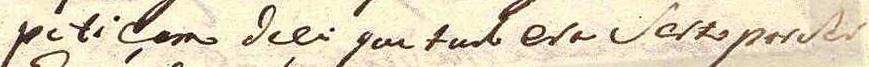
petiçam deçi que tudo era serto por ser
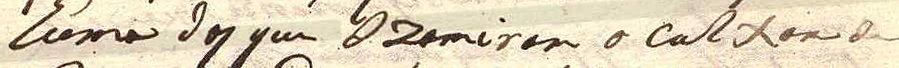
huma dos que Izamiram o culxam de
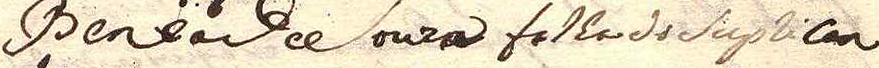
Benta de souza filha do suplican
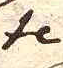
te
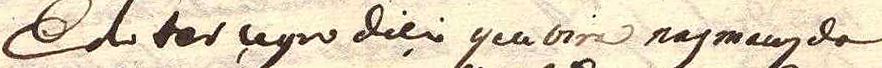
E do terceyro diçi que vira nas maos da
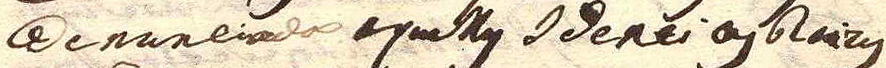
denunciada aquellas Identicas Raizes
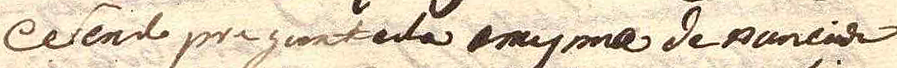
e sendo preguntada a mesma denunciada
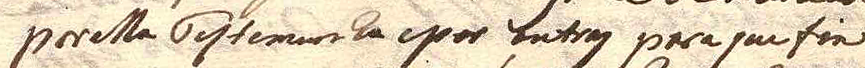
por ella Testemunha e por outras para que fin
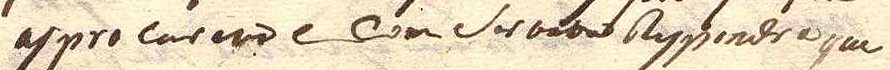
as procuram e comservam Respondra que
